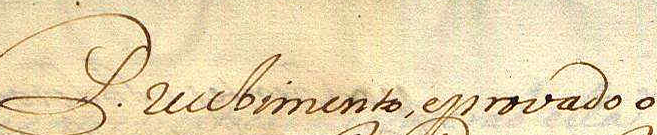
P. recebimento, e provado o
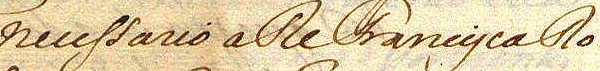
necessario a Re Francisca Ro
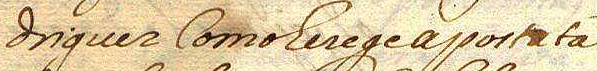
driguez Como herege apostata
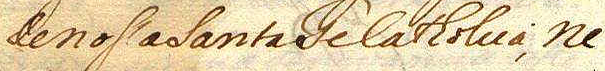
de nossa Santa Fe Catholica, ne
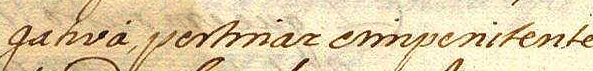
gativa, pertinaz e impenitente
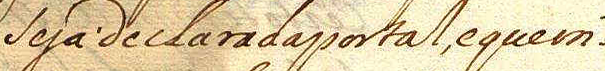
seja declarada por tal, e que in
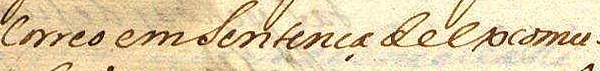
correo em Sentença de excomu
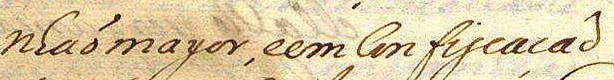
nhaõ mayor, e em Confiscaçaõ
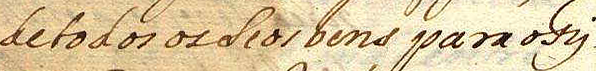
de todos os Seos bens para o Fis
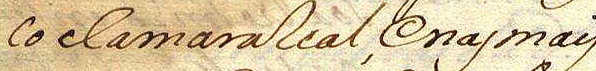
co e Camara Real, e nas mais
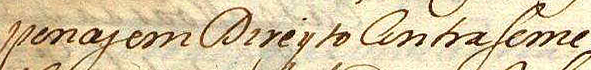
penas em Direyto contra seme
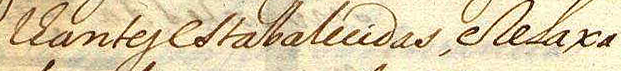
lhantes eStabelecidas, e Relaxa
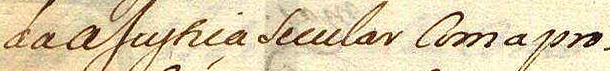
da a Justiça secular com a pro
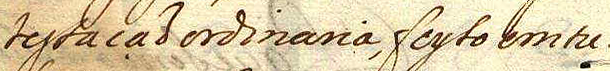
testaçaõ ordinaria, feyto em tu
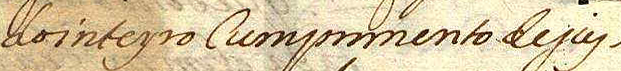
do inteyro cumprimento de jus
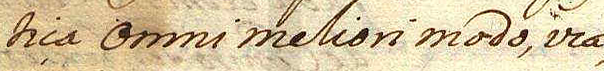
tiça omni meliori modo, via
